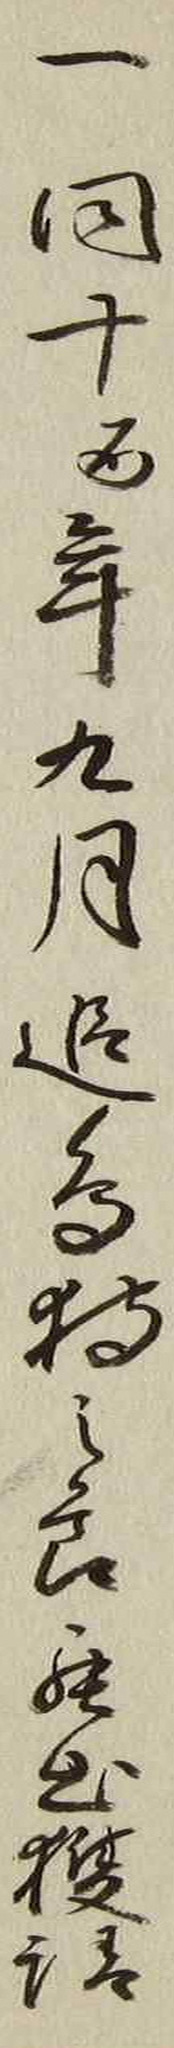一同十酉年九月追鳥狩之節罷出獲請
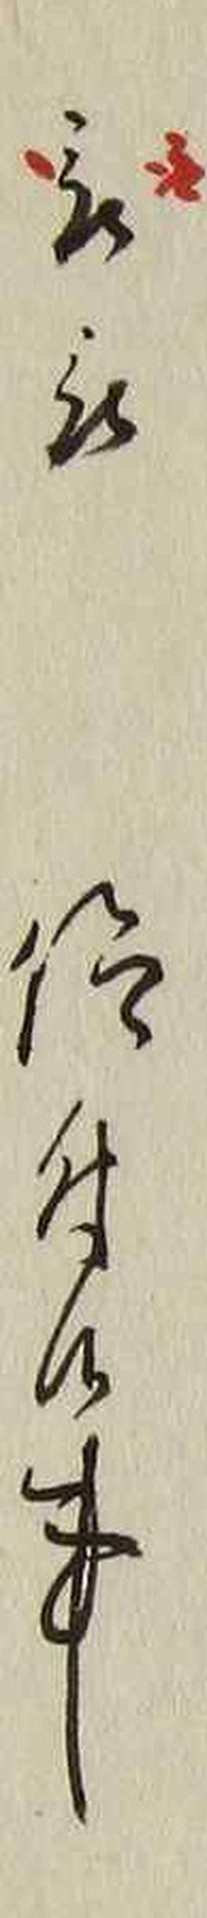旨被仰出候事
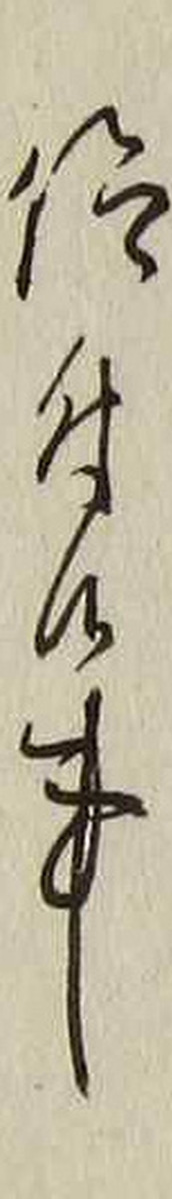仰付候事
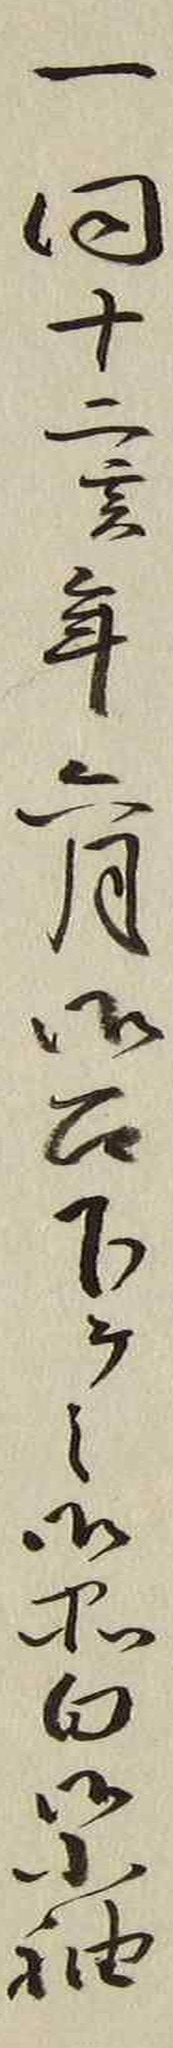一同十二亥年六月御召下ケ之御品白御小袖
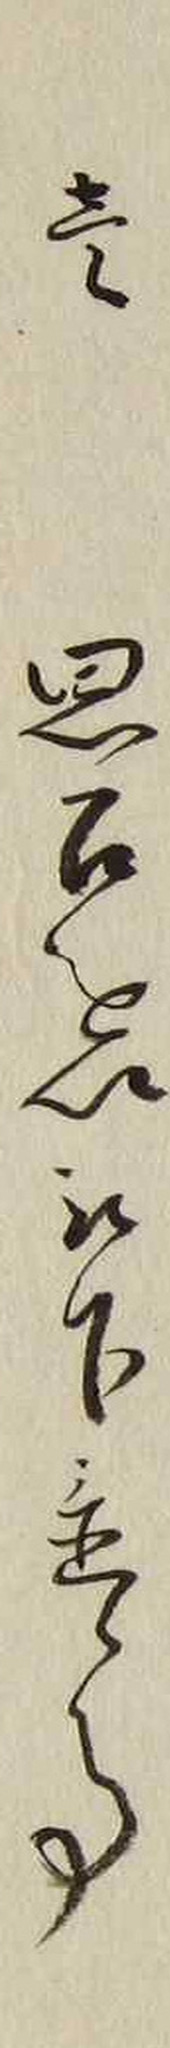壱思召を以被下置候事
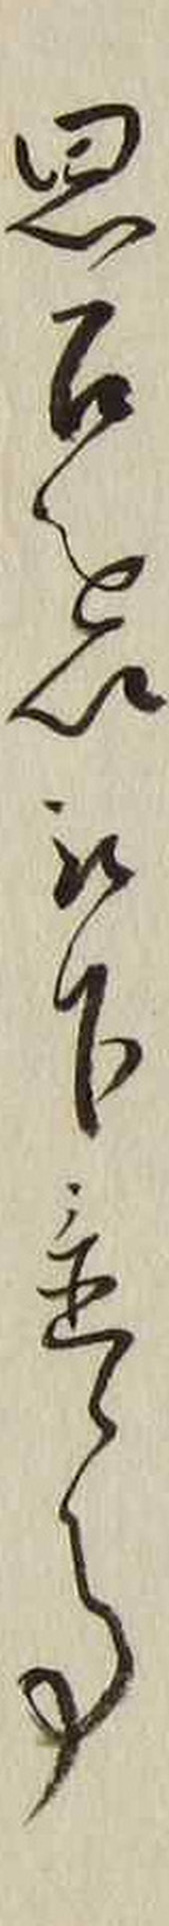壱思召を以被下置候事
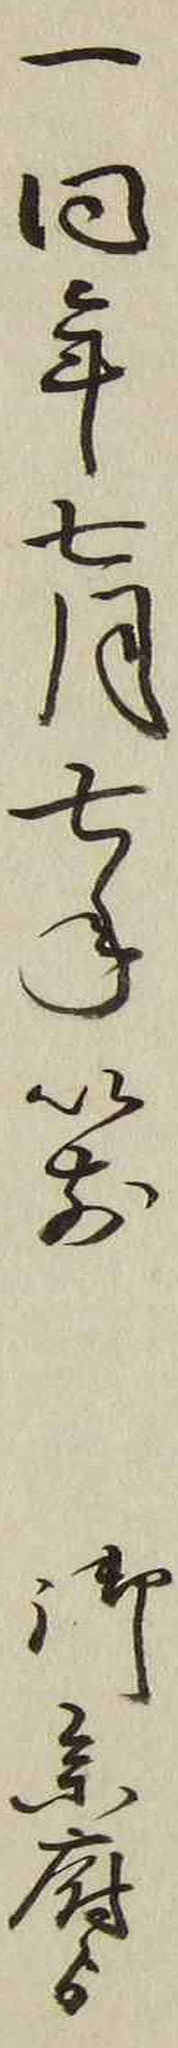一同年七月七年以前御参府ゟ

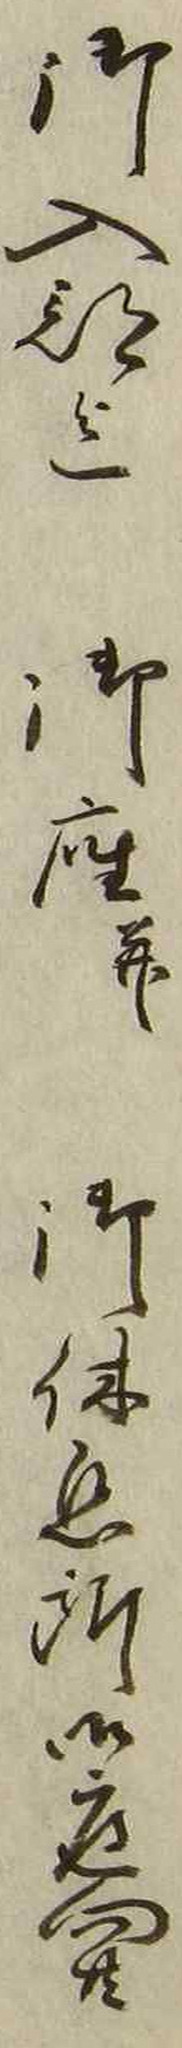御入部迄御座并御休息所御庭向共
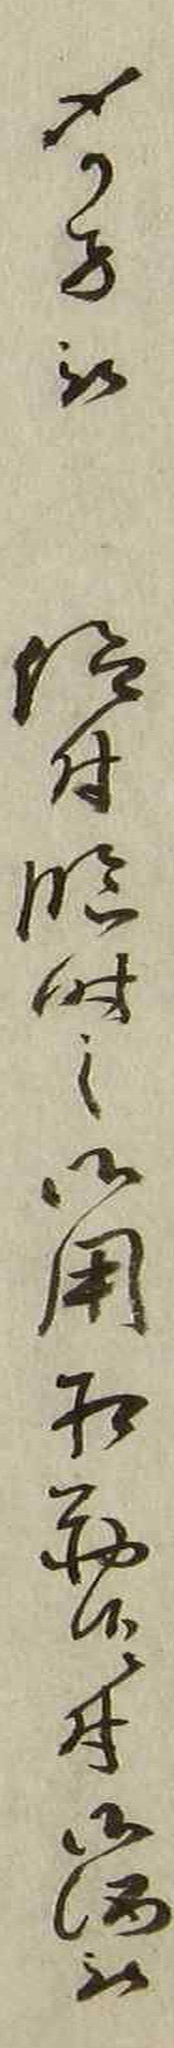〆り方被仰付臨時之御用相勤候ニ付御酒被
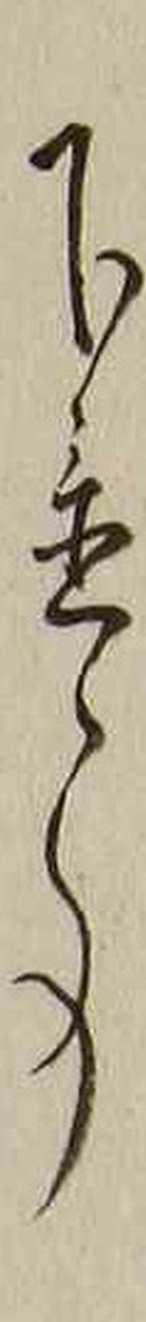下置候事
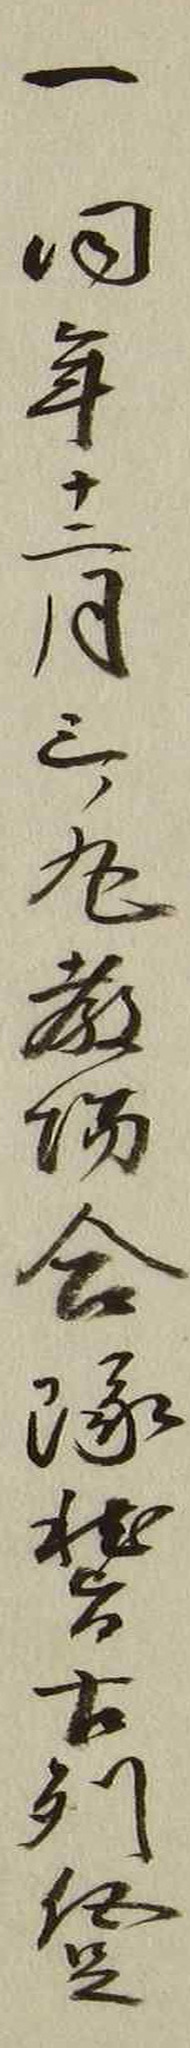一同年十二月三ノ丸教場合隊稽古列伍足
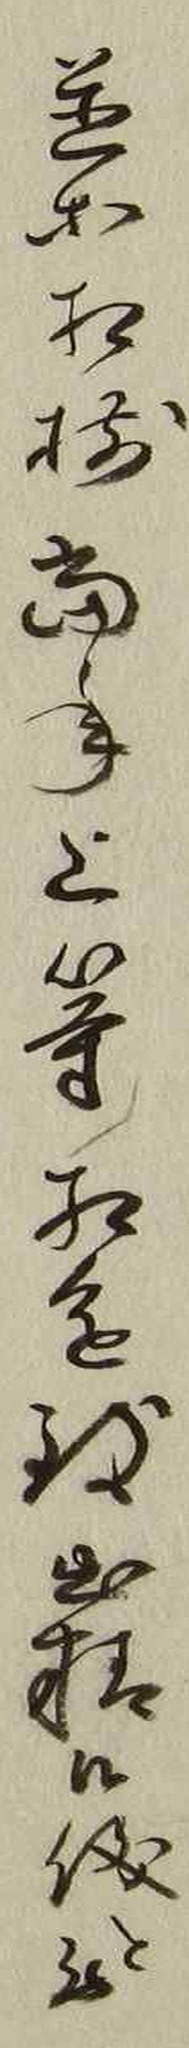並等相揃当年上等相進致出精候儀と被
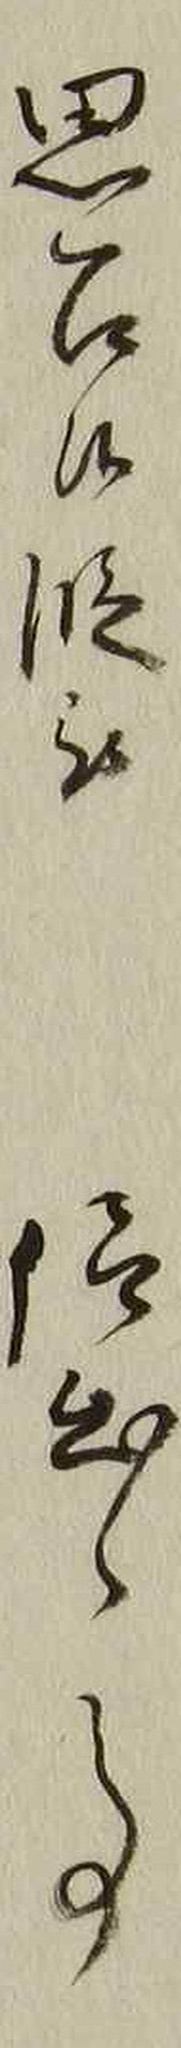思召候段被仰出候事
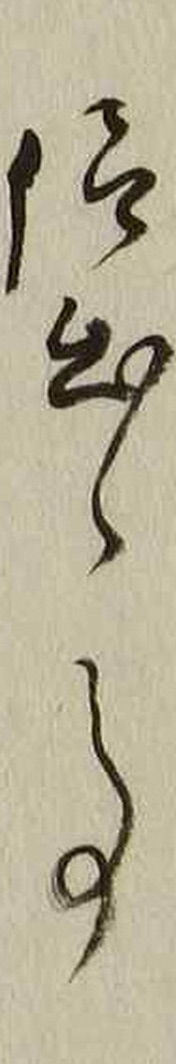仰出候事
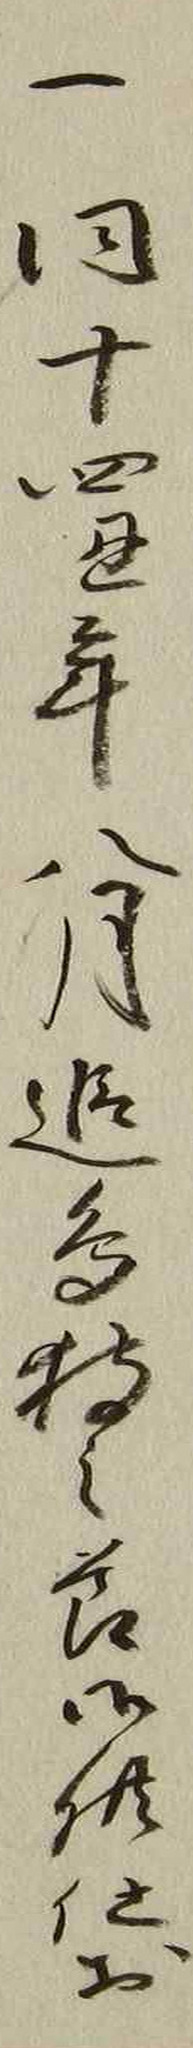一同十四丑年八月追鳥狩之節御供仕於
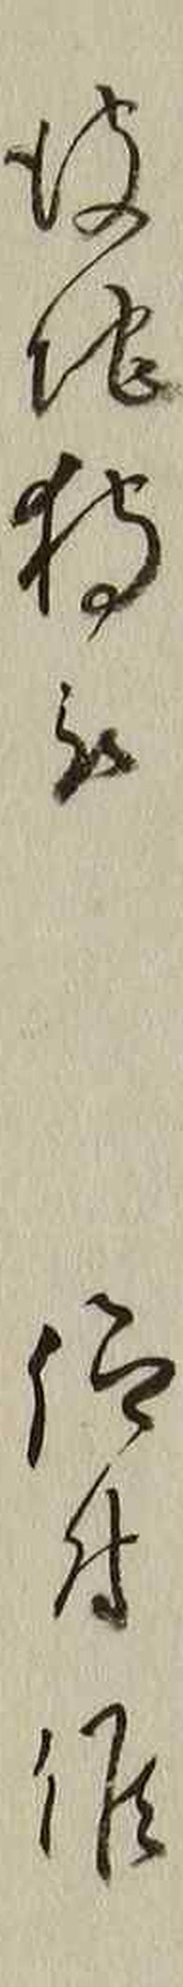彼地狩被仰付候
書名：諸士系譜　巻之4　い之部4
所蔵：会津若松市立会津図書館
